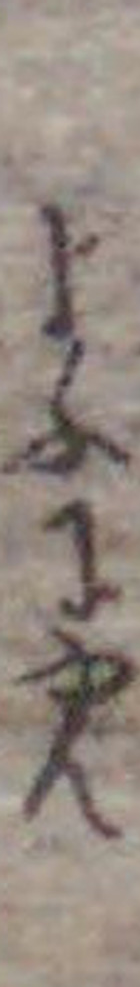よふにやん
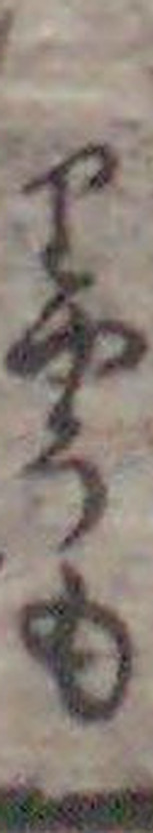りやうも
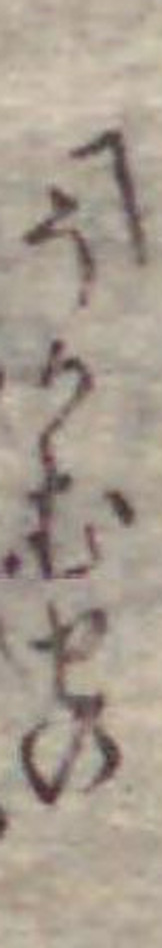〽うかむせの
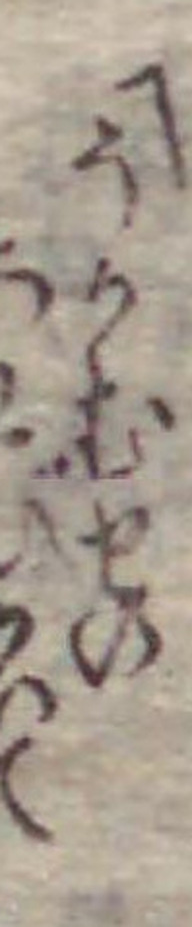〽うかむせの
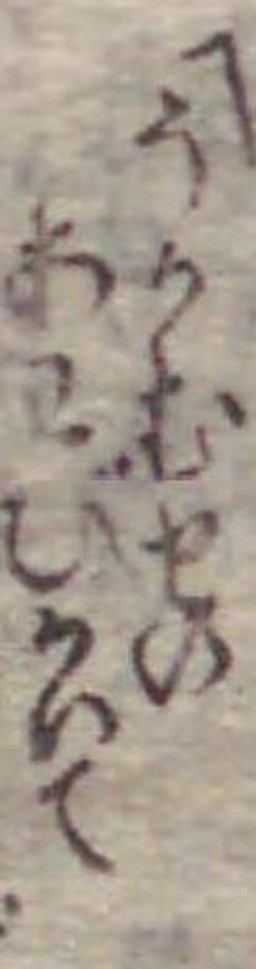あわびかいて
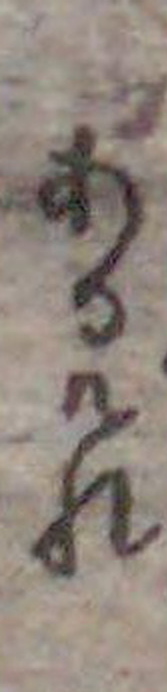あるけれ
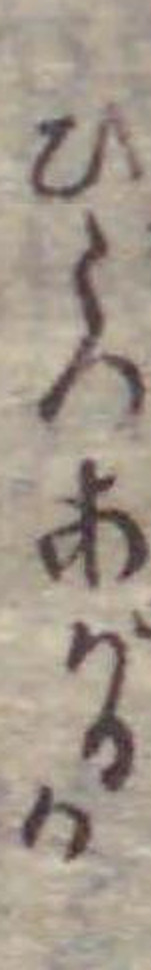ひとつあがる

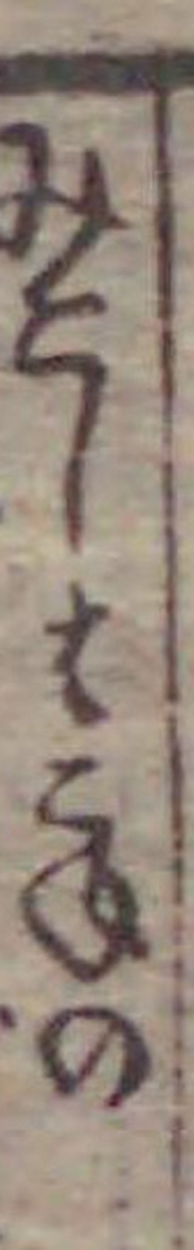みこしはこねの
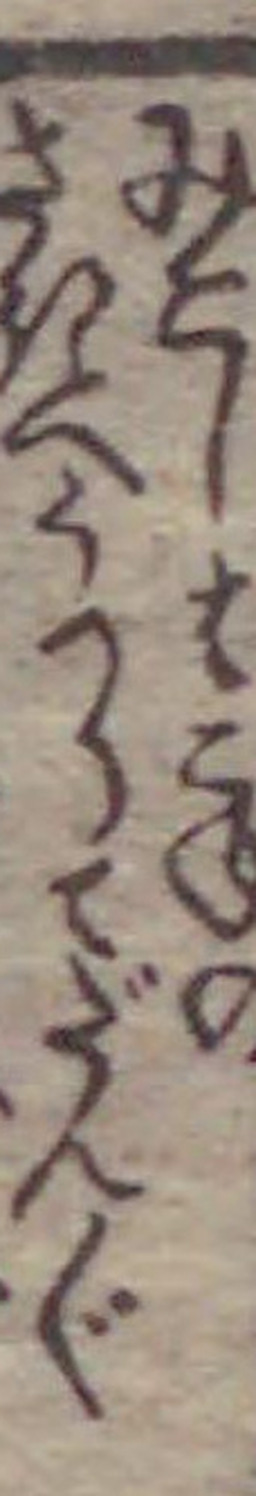さきへうつりてだん〴〵
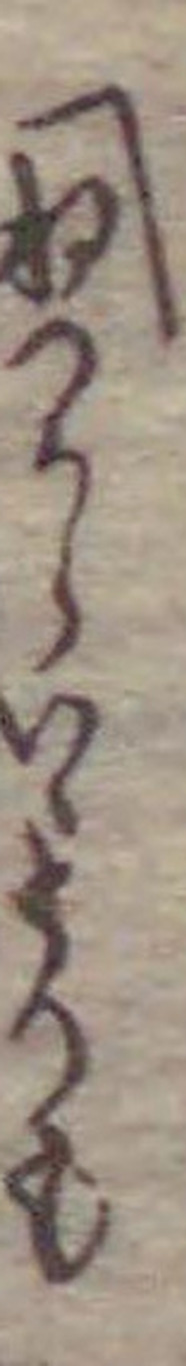〽ねつからいゝとりも
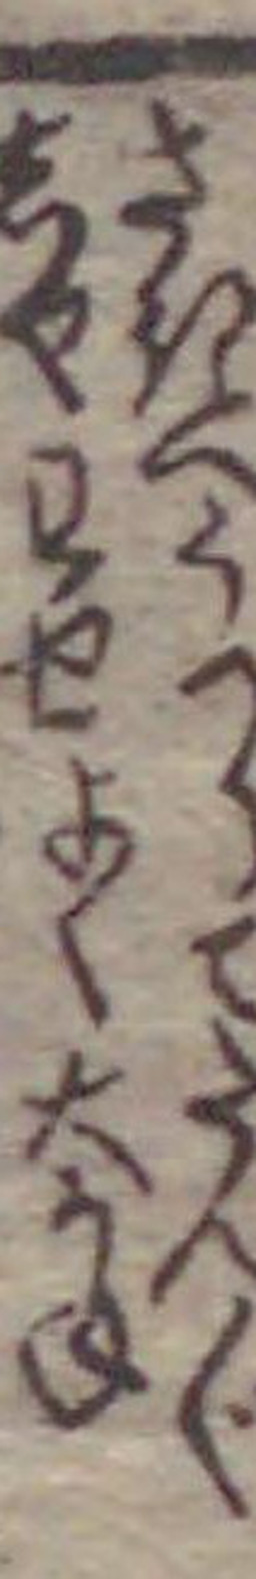しやわせよく大かね
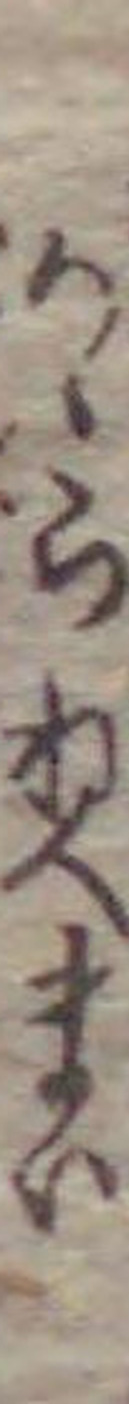かゝらねへまい
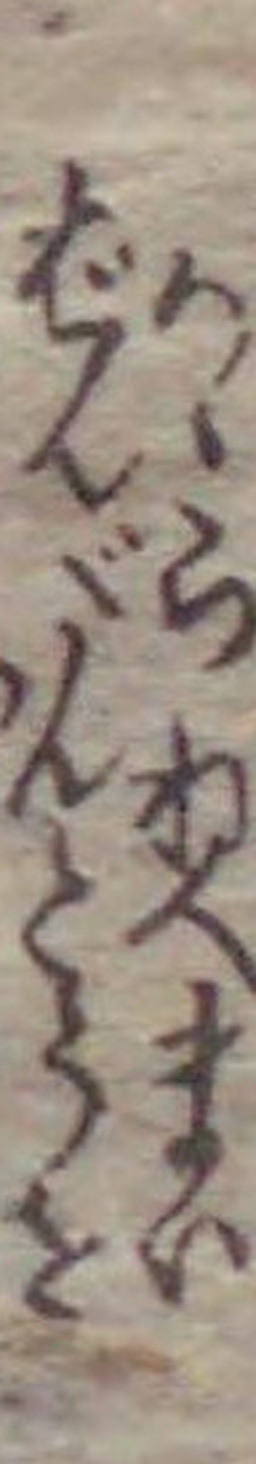ばんべんとうを
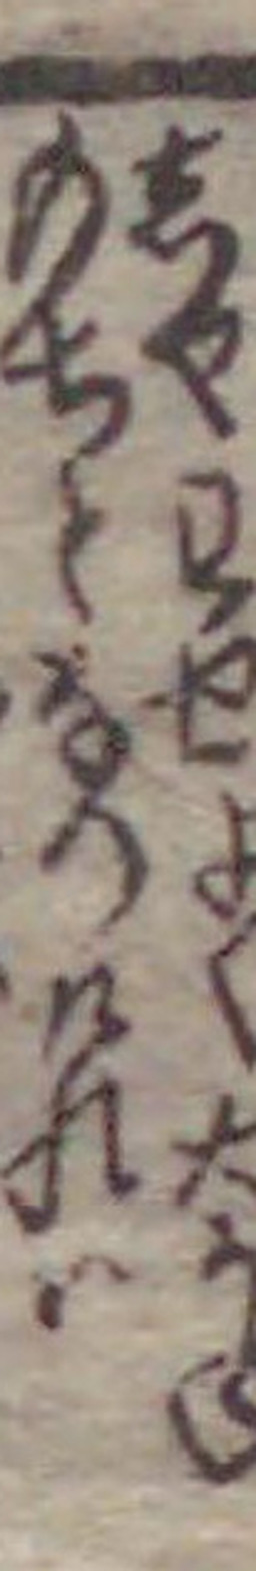もちとなりけれは
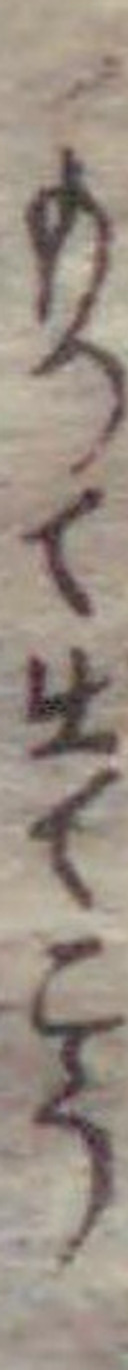もつて出てこう
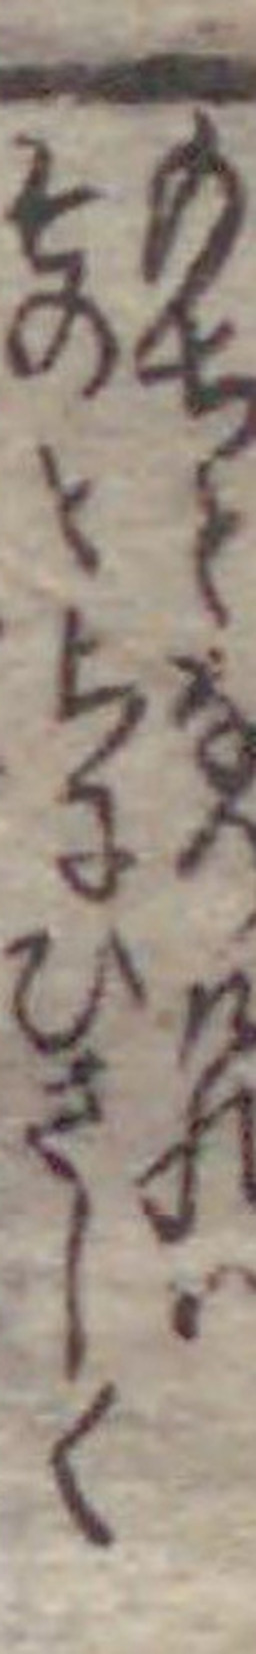そのとちにひさしく
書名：化物見世開 : 2巻
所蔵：国立国会図書館 National Diet Library, JAPAN
